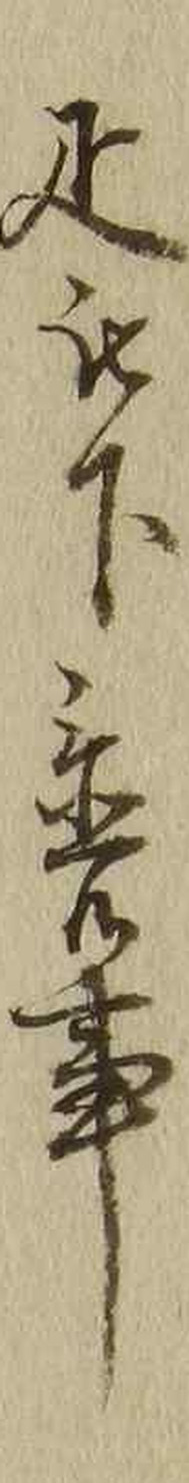疋被下置候事
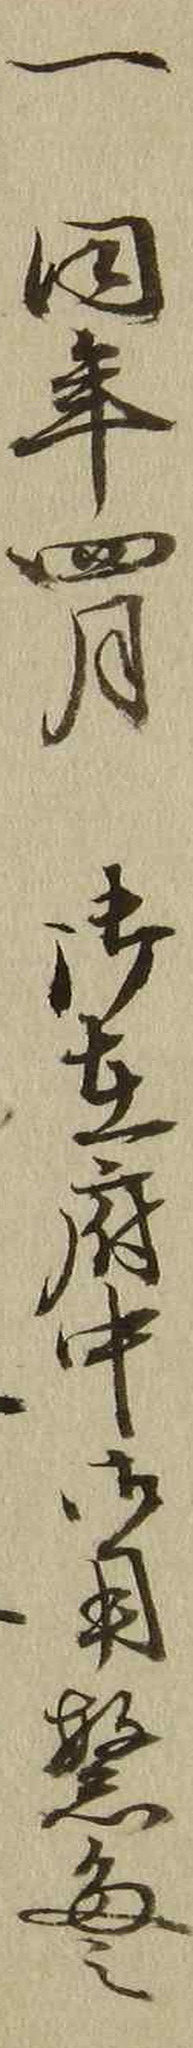一同年四月御在府中御用繫多之
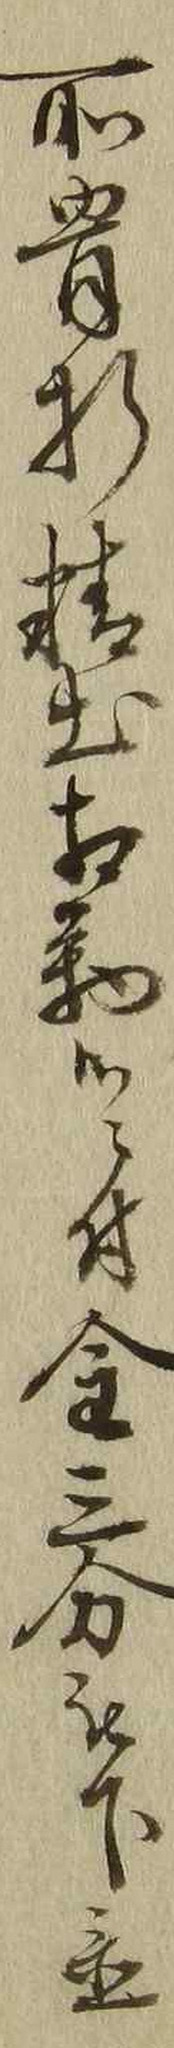所骨折精出相勤候ニ付金三分被下置
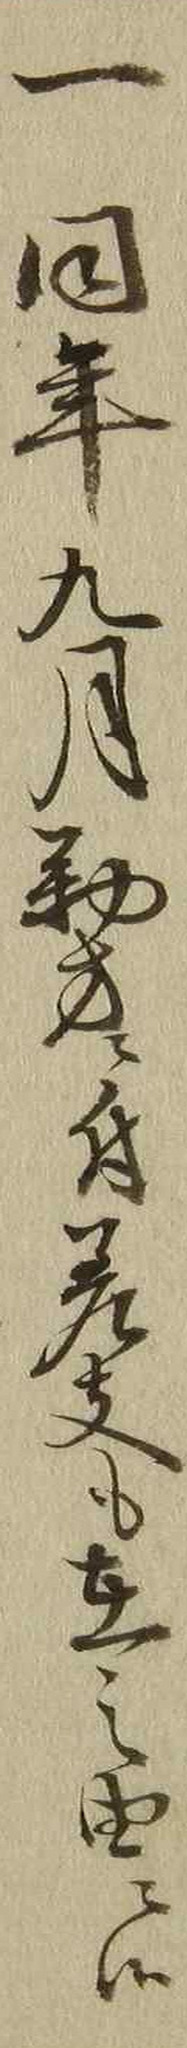一同年九月勤方ニ付差支も在之由ニ候
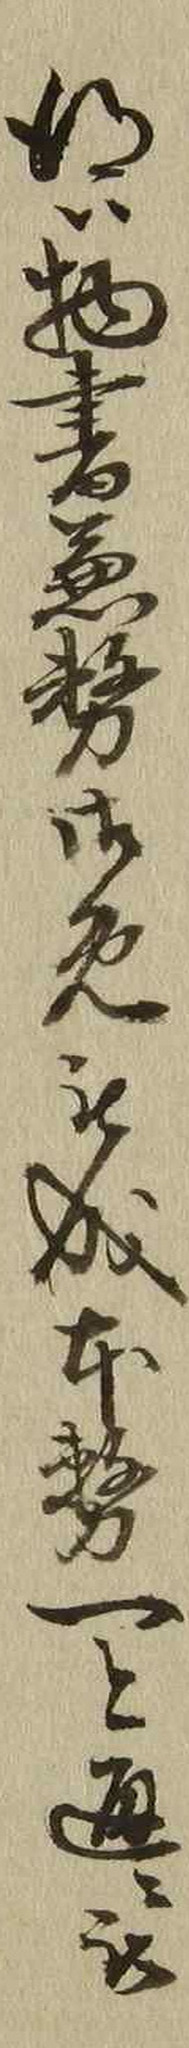得ハ物書兼務御免被成本務一と通ニ被
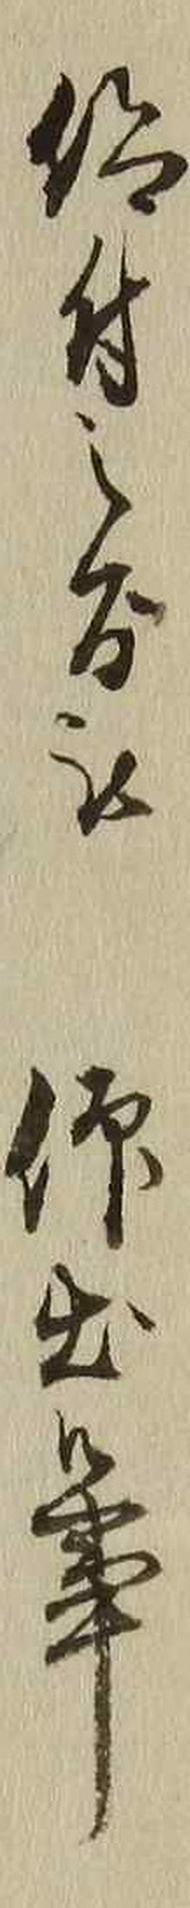仰付之旨被仰出候事
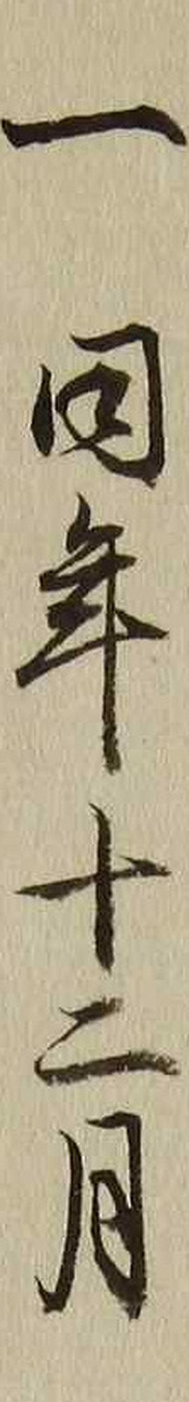一同年十二月
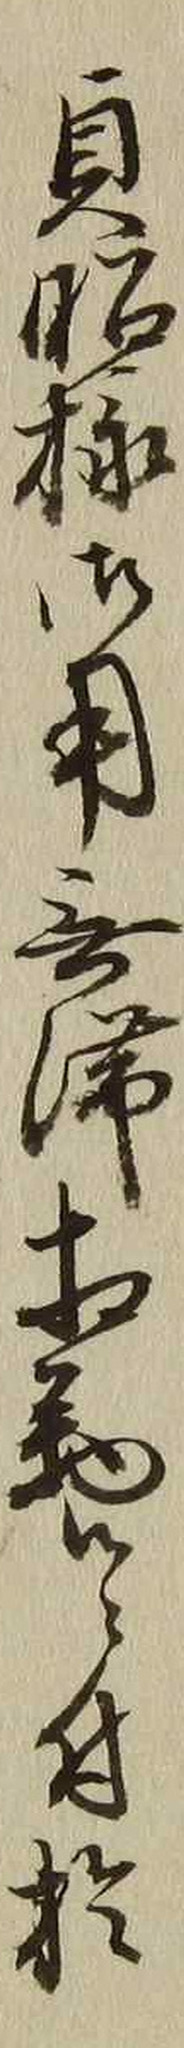貞昭様御用無滞相勤候ニ付於
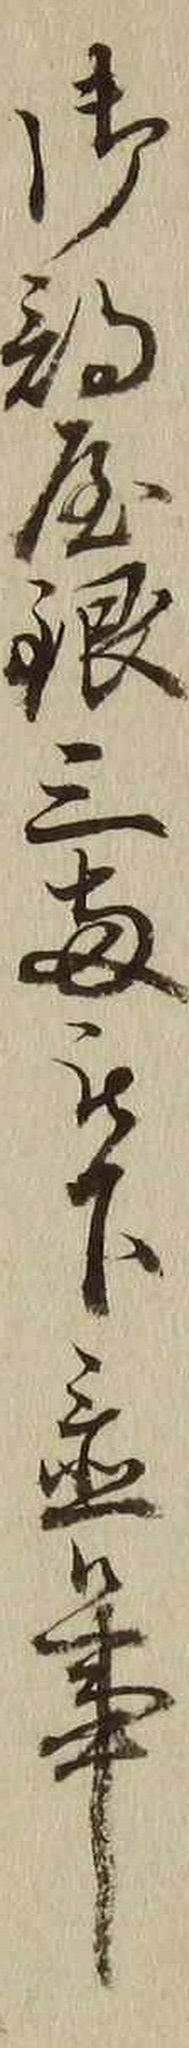御部屋銀三両被下置候事
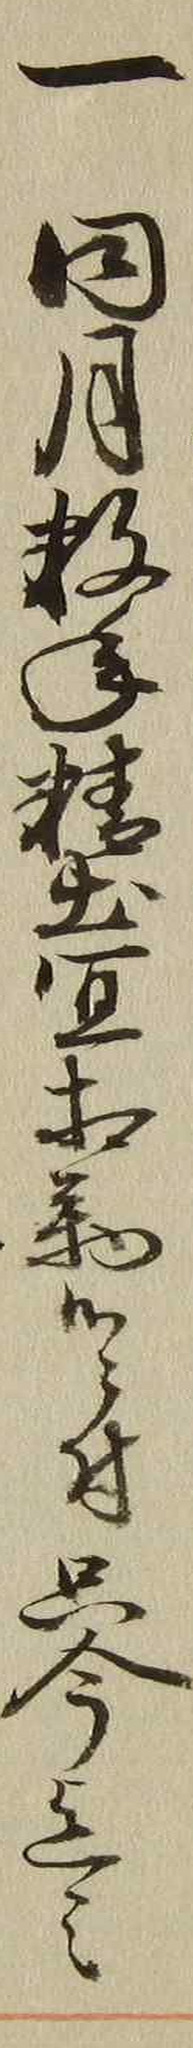一同月数年精出宜相勤候ニ付只今迄之
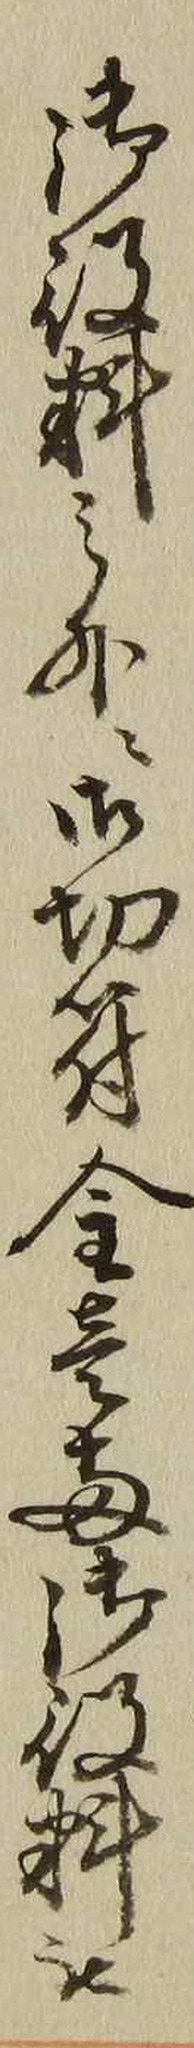御役料之外ニ御切符金壱両御役料被
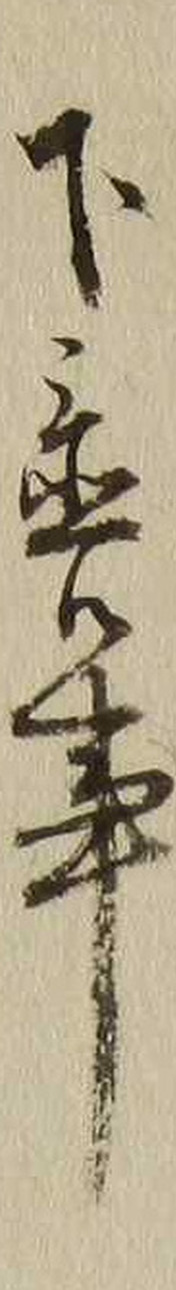下置候事
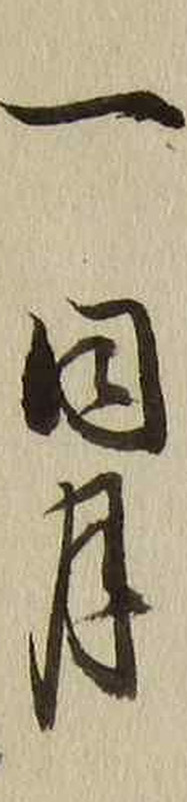一同月
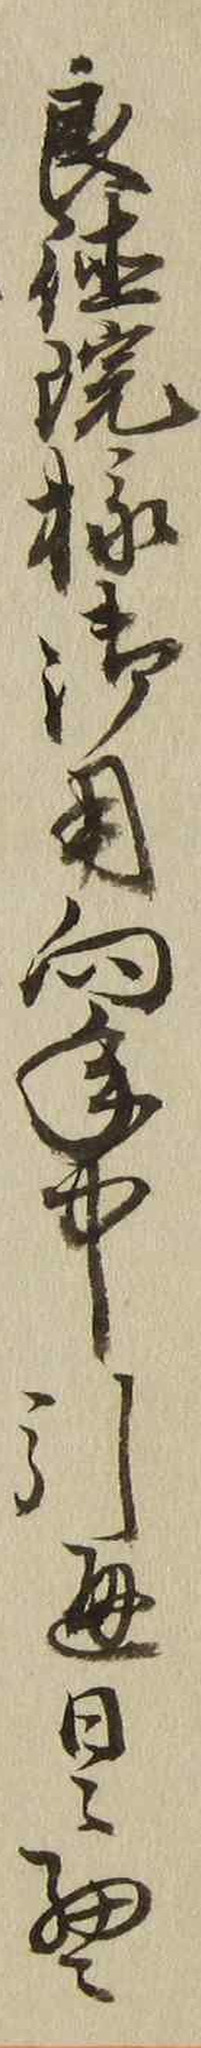良徳院様御用向年中引通日々細々
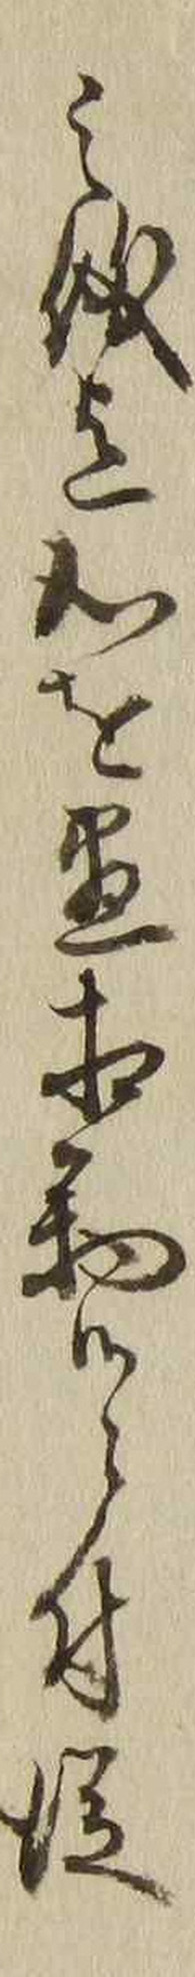之儀迄心を懸相勤候ニ付従

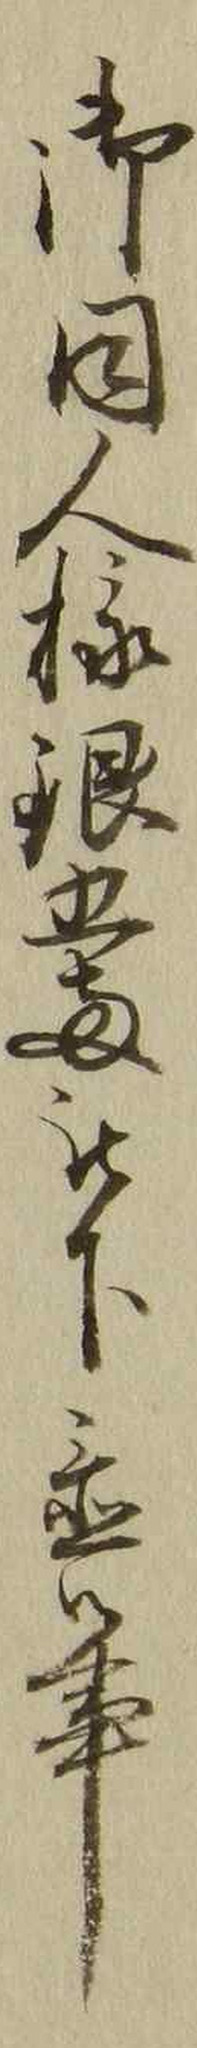御同人様銀五両被下置候事
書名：諸士系譜　巻之64　と之部7
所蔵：会津若松市立会津図書館
